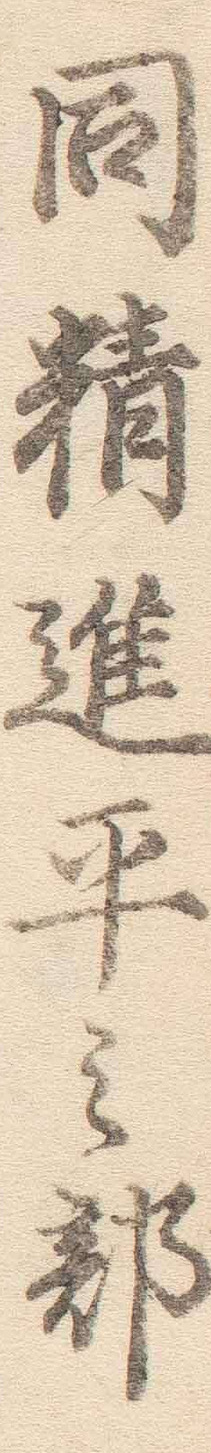同精進平之部
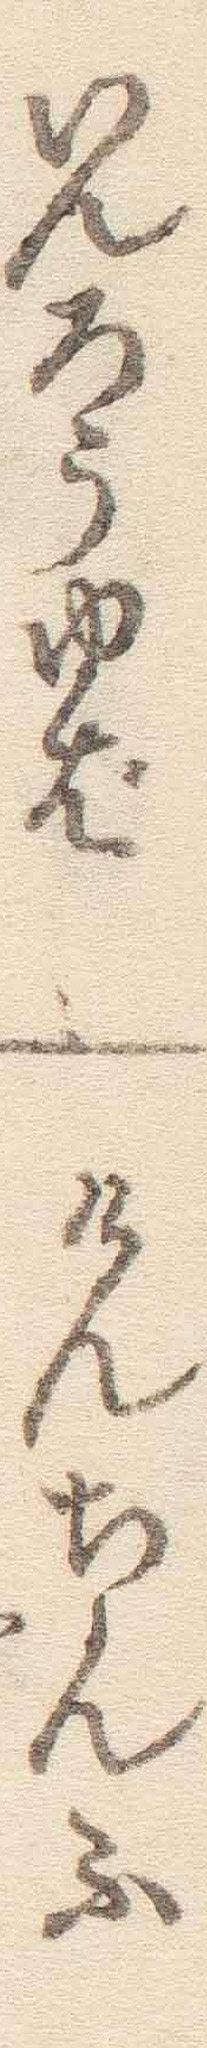いんろうゆばけんちんふ
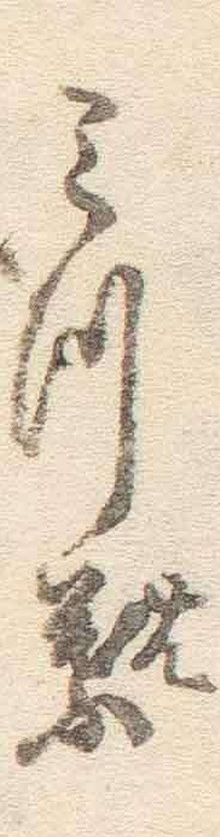三つ葉
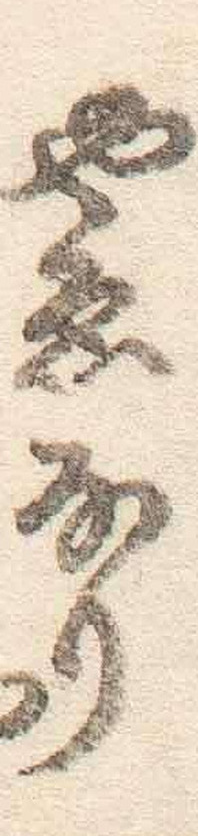やゑなり
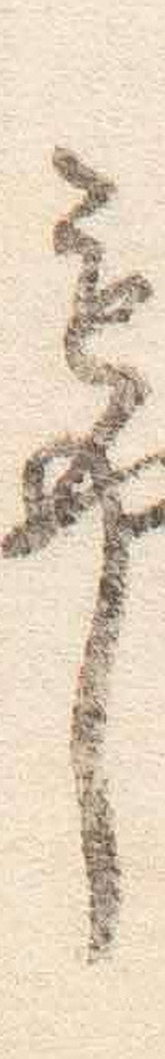もやし
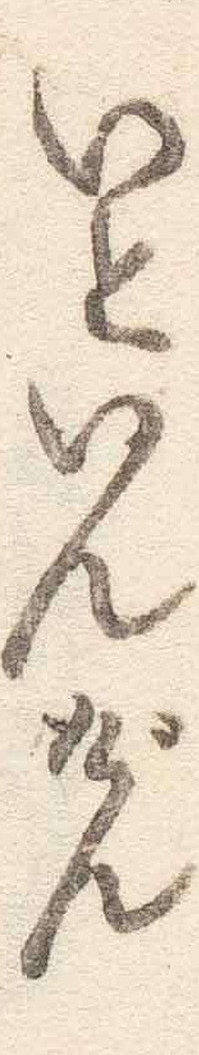つけいんげん
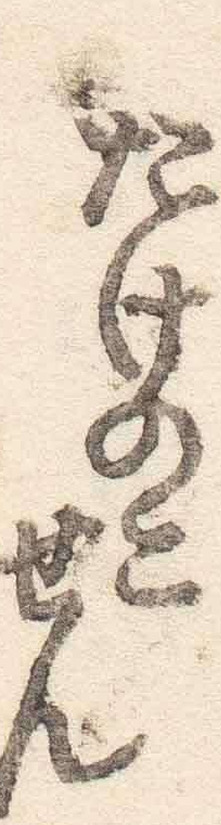たけのこ穂せん
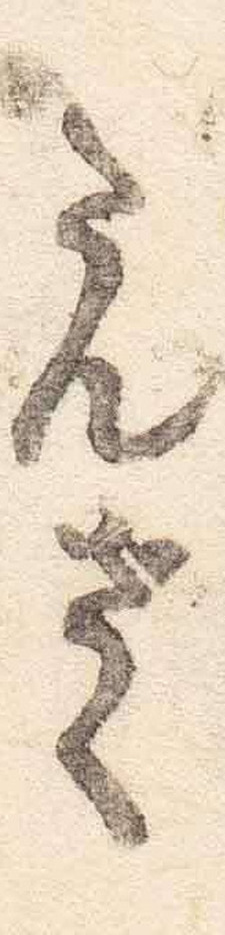たんざく
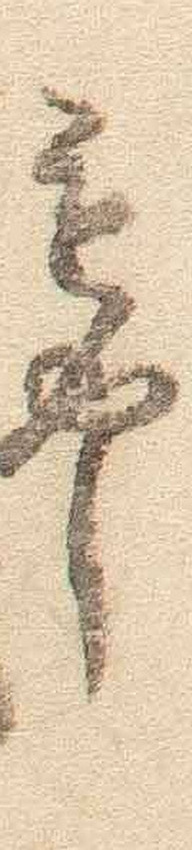もやし
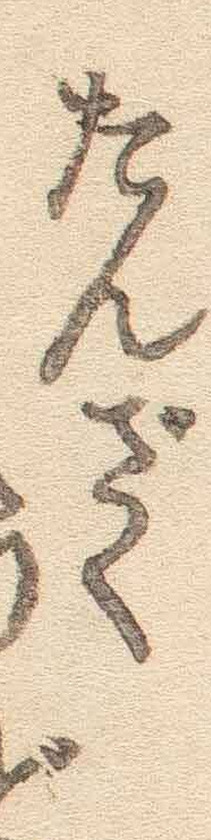たんざく
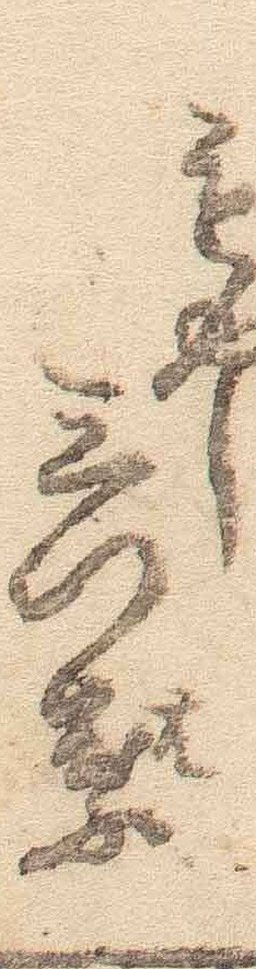三つ葉
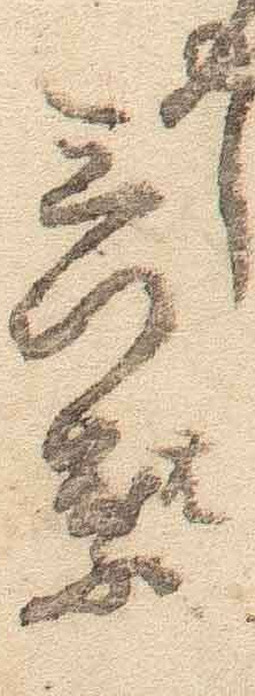三つ葉
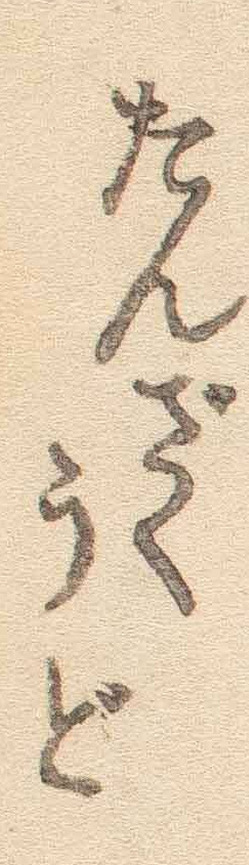たんざく

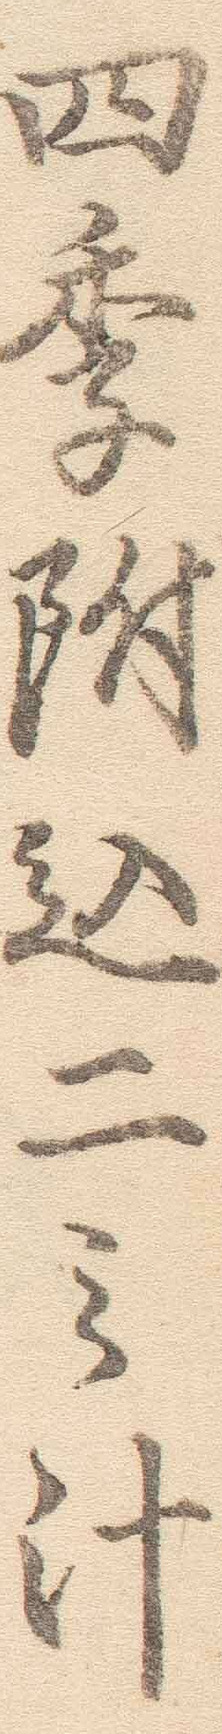四季附込二之汁
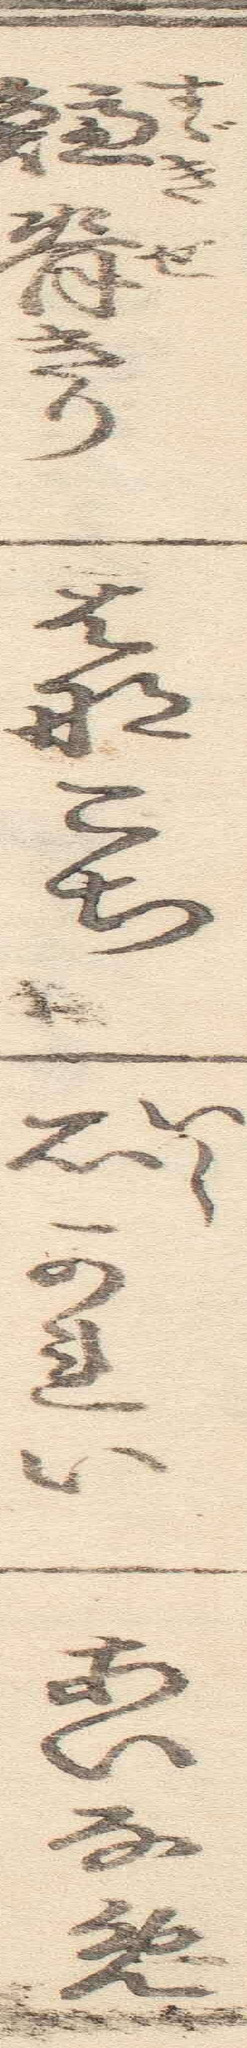鱸背きりはなこち
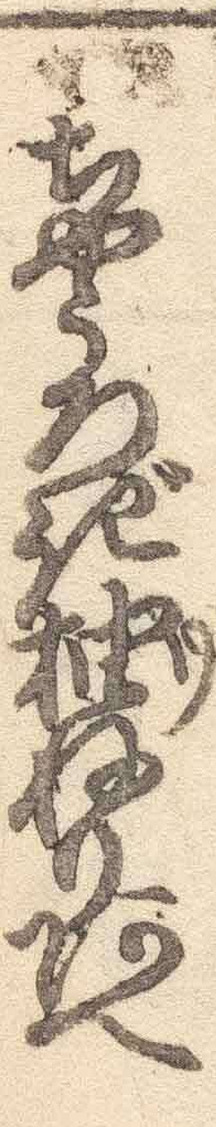ちやうろぎ柚ねりあへ
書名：料理通
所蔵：東京学芸大学附属図書館 国文学研究資料館
